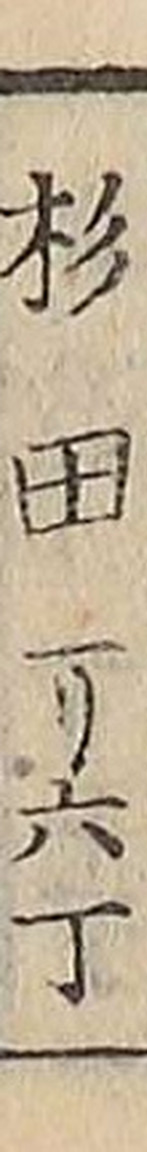杉田一リ六丁
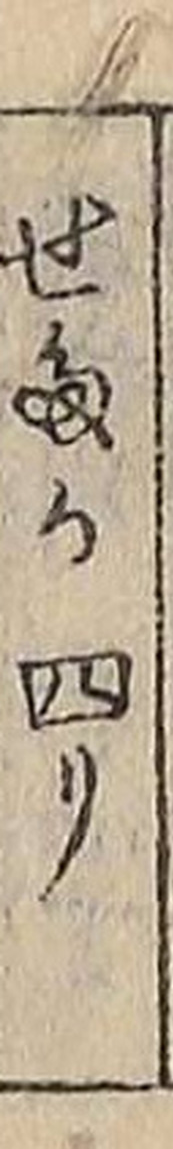せたか四リ
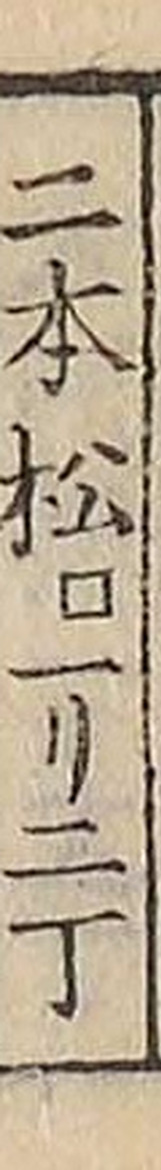二本松▫一リ二丁
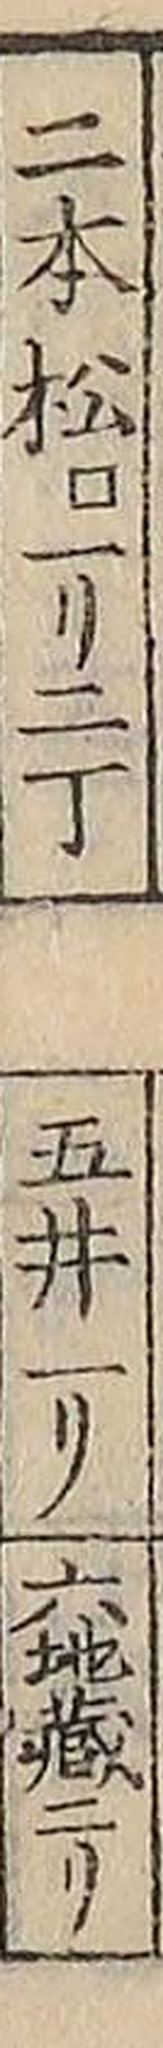二本松▫一リ二丁
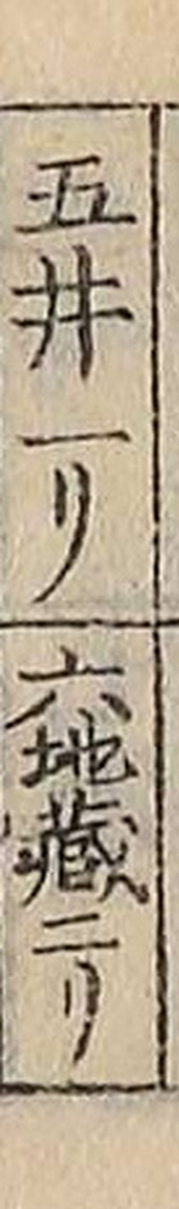五井一リ六地蔵二リ
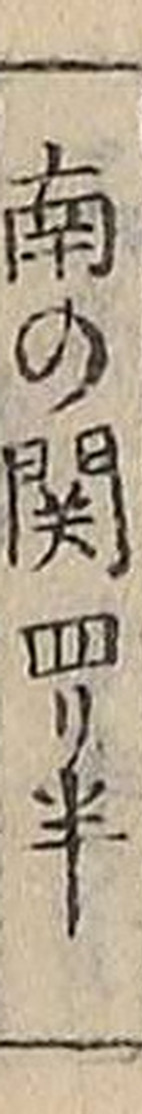南の関四リ半
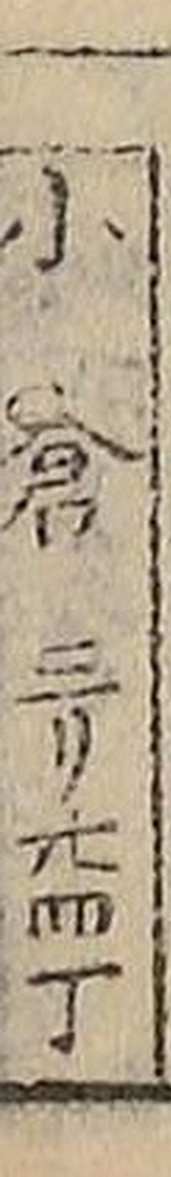小倉三リ廿四丁
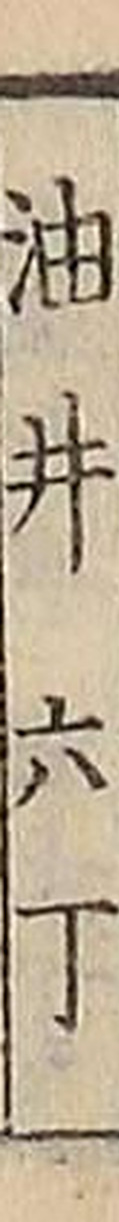油井六丁
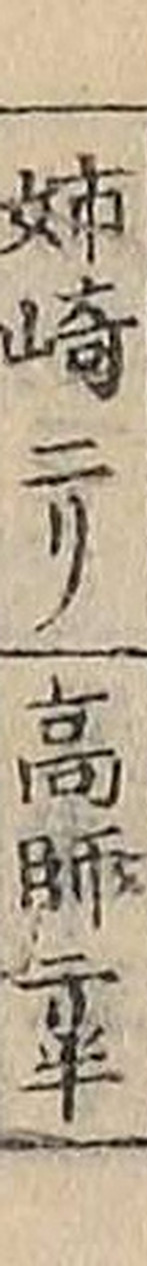姉崎二リ高師二リ半
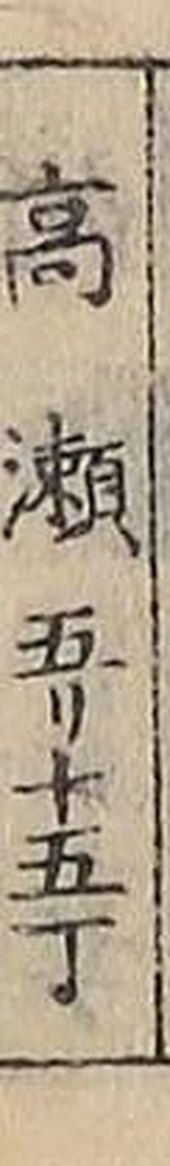高瀬五リ十五丁
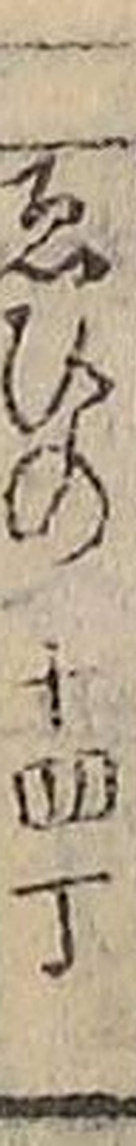ゑひの十四丁
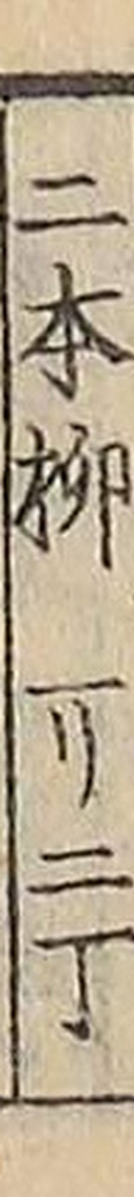二本柳一リ二丁
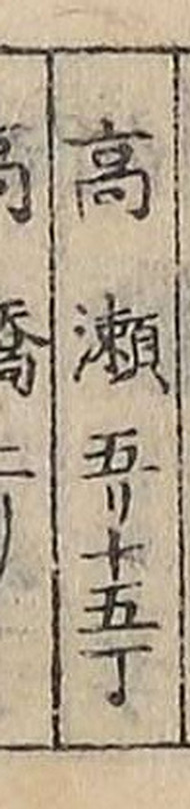高瀬五リ十五丁
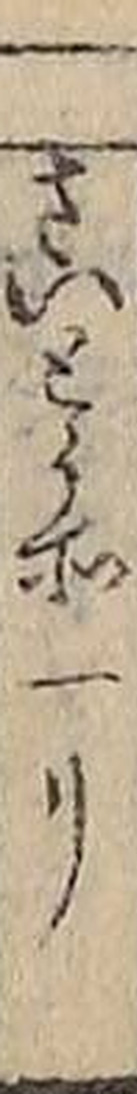さいとう所一リ
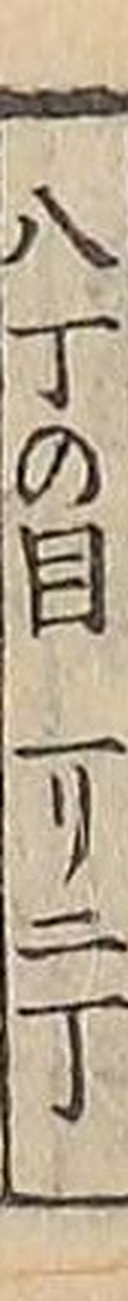八丁の目一リ二丁
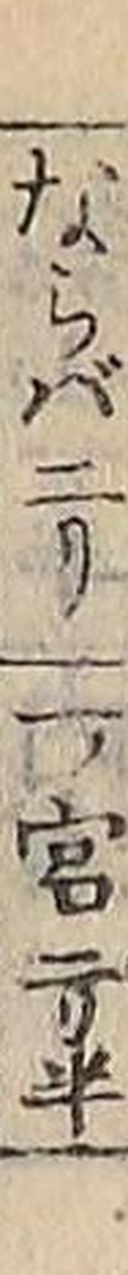ならば二リ一ノ宮二リ半
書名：旅行用心集
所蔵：神戸大学附属図書館 国文学研究資料館
